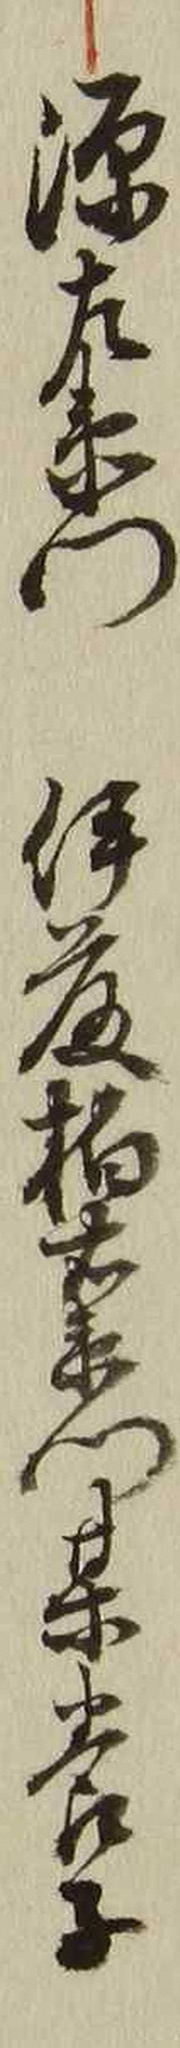源左衛門伊藤拍右衛門某養子
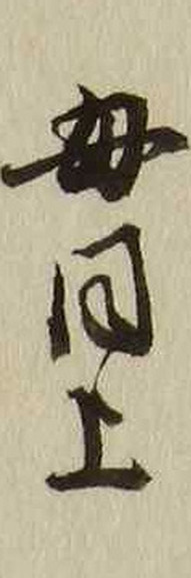母同上
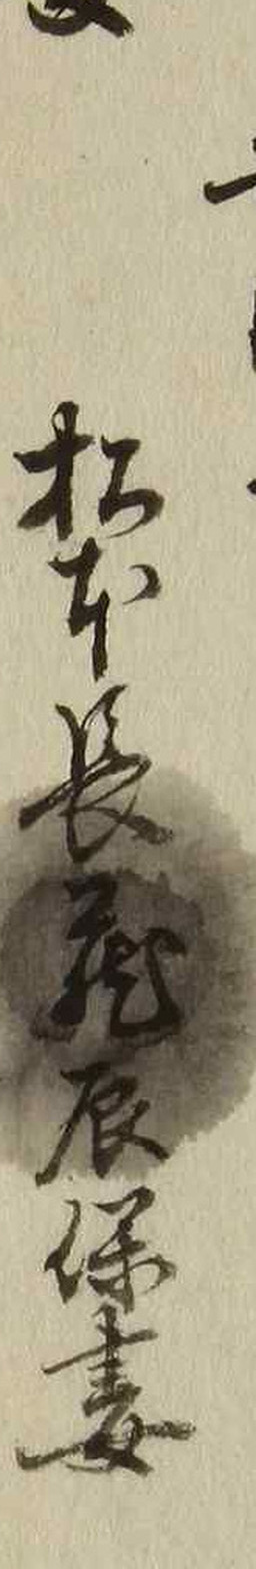女松本長蔵辰保妻
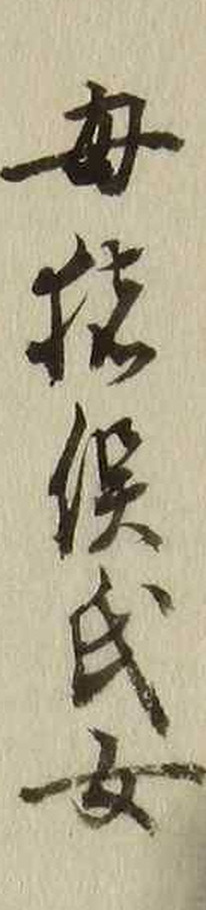母猪俣氏女
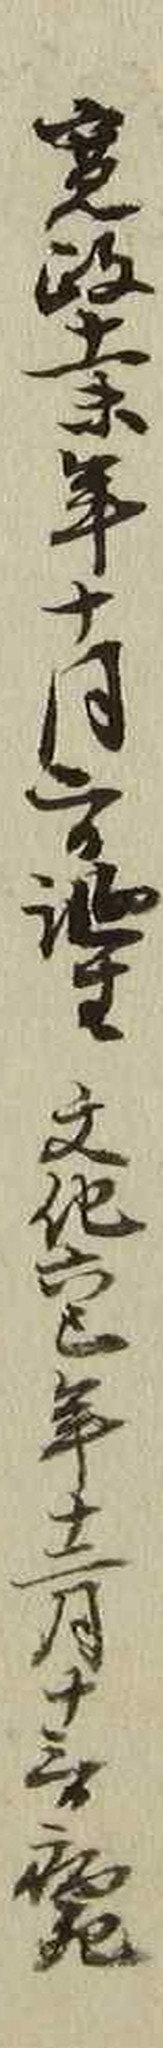女寛政十一未年十月二日誕生文化六巳年十二月十三日病死
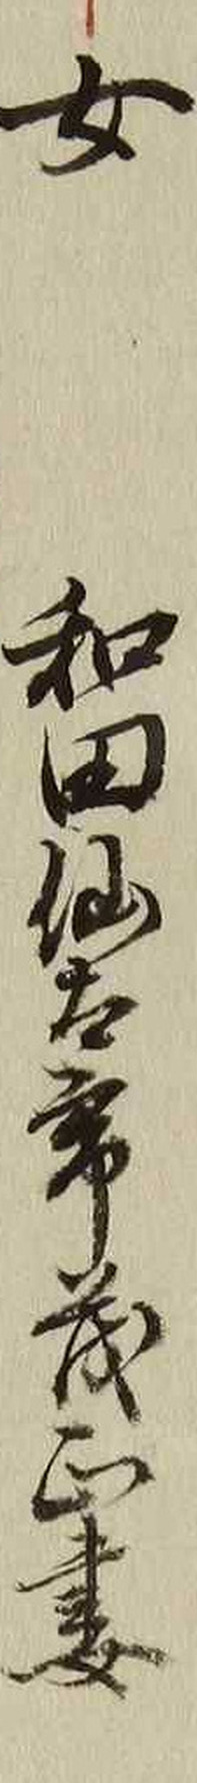女和田仙太郎茂正妻
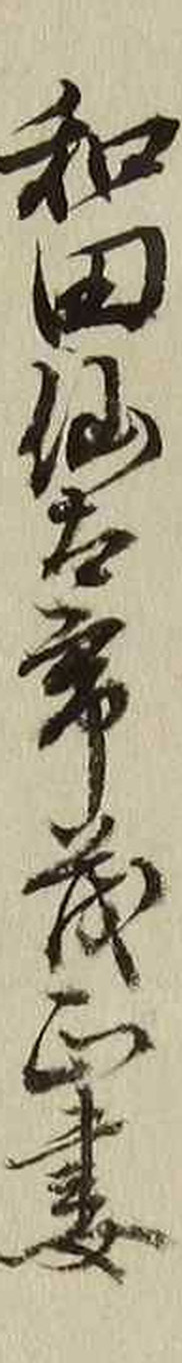女和田仙太郎茂正妻
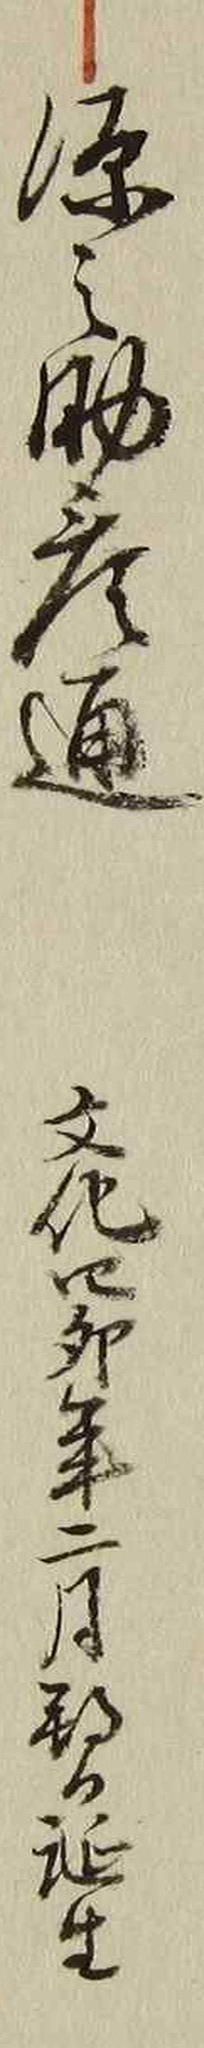源之助彦通文化四卯年二月朔日誕生
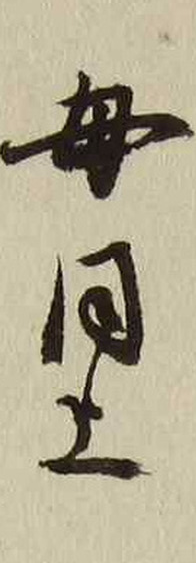母同上
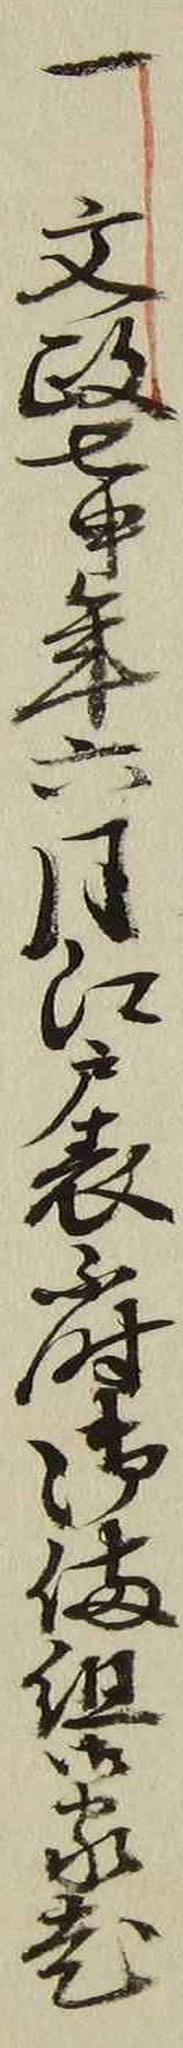一文政七申六月江戸表不時御備組御家老
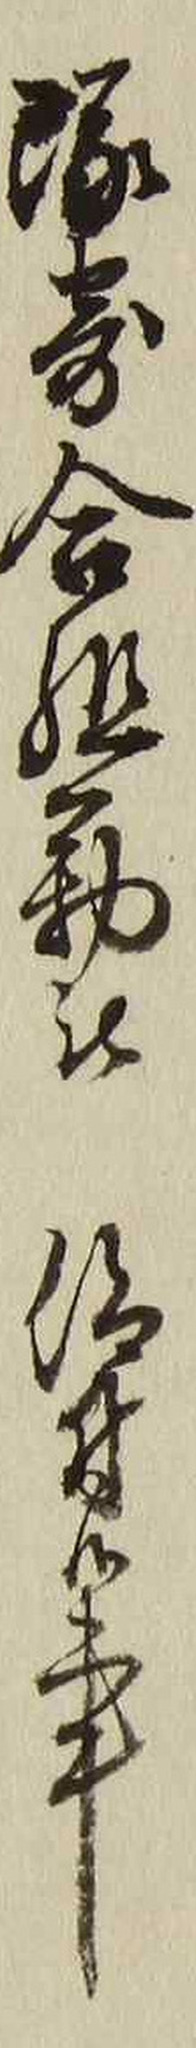隊寄合組勤被仰付候事
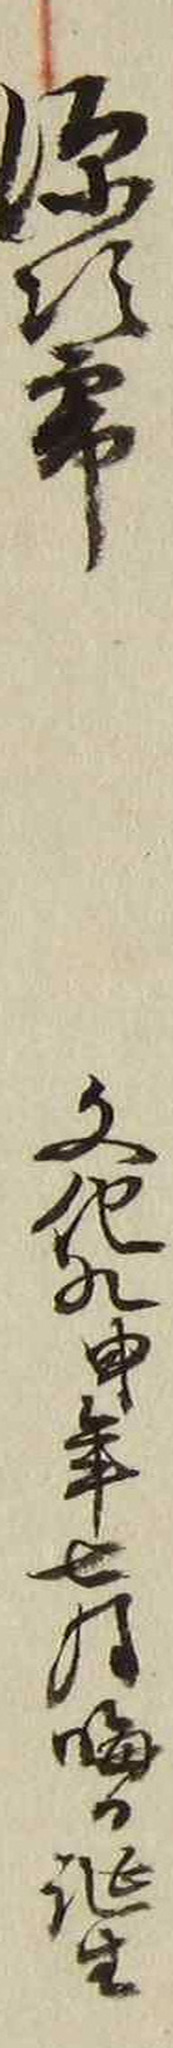源次郎文化九申年七月晦日誕生
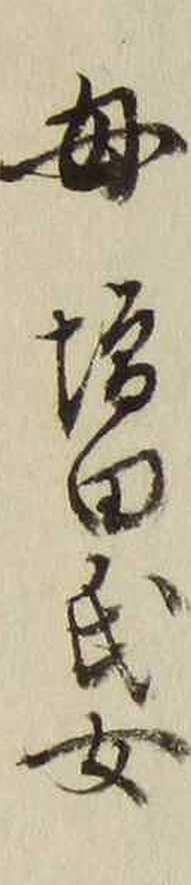母増田氏女

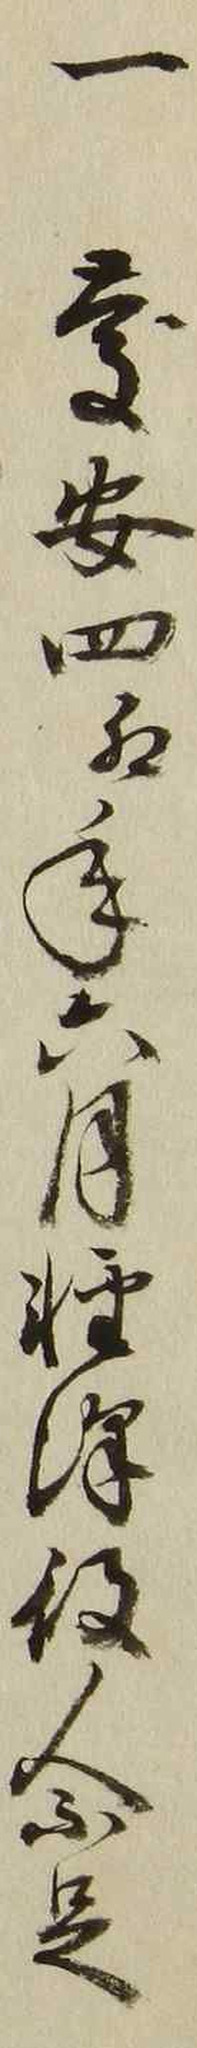一慶安四卯年六月役人不足
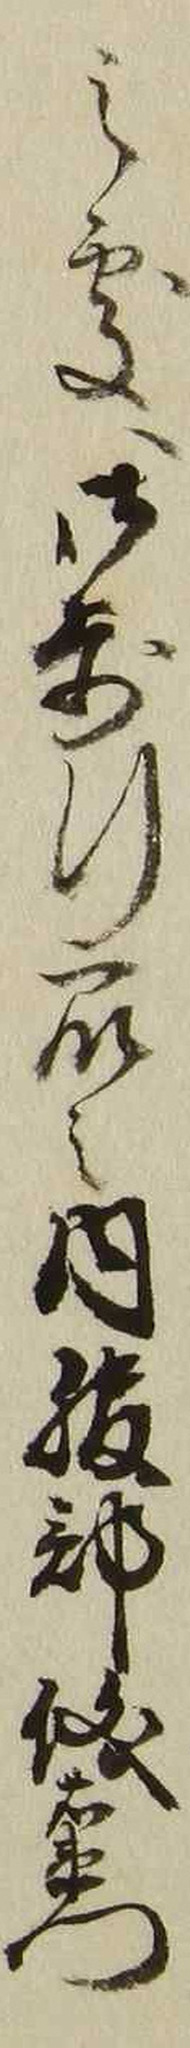之処へ御歩行衆之内服部儀右衛門
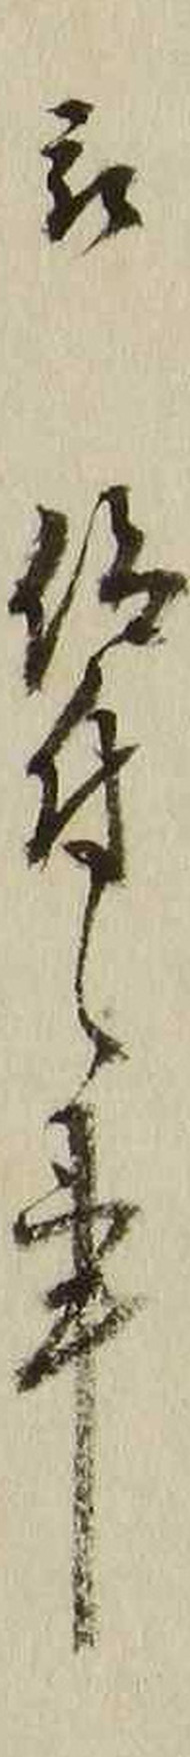被仰付候事
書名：諸士系譜　巻之38　は之部6
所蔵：会津若松市立会津図書館
